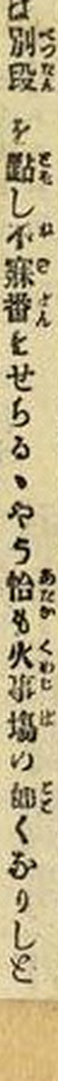を點し不寐番をせらるゝやう恰も火事塲の如くなりしを
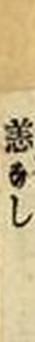恙なし
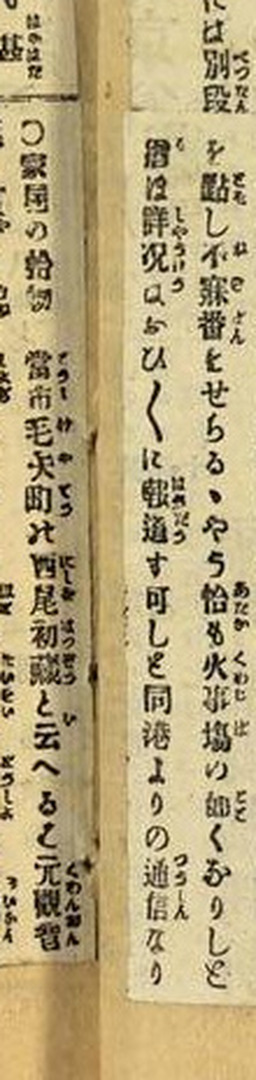猶ほ詳況はおひ〳〵報道す可しと同港よりの通信なり
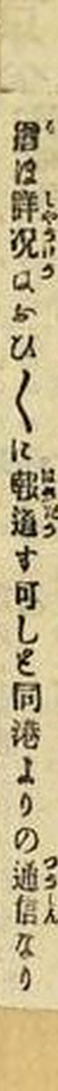猶ほ詳況はおひ〳〵報道す可しと同港よりの通信なり
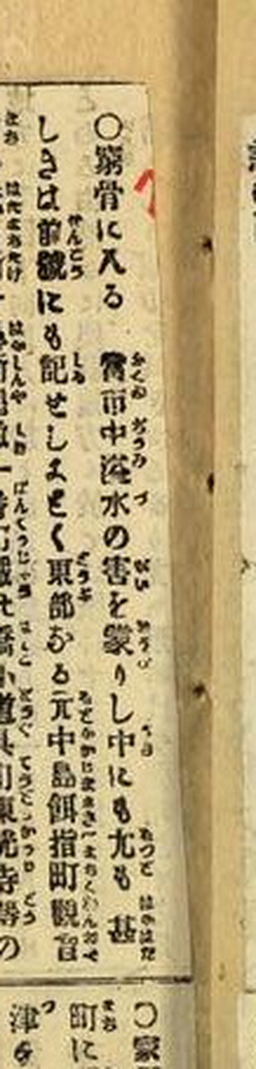○窮骨に入る當市中溢水の害を蒙りし中にも尤も甚
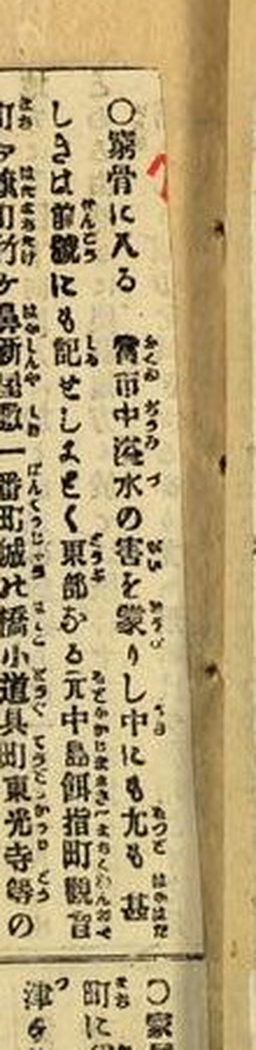○窮骨に入る當市中溢水の害を蒙りし中にも尤も甚
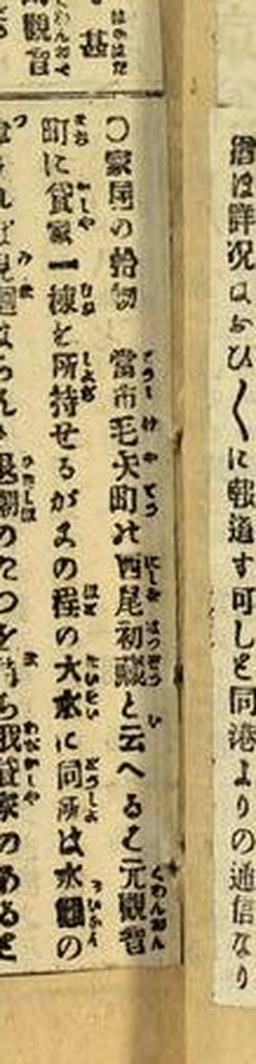○家屋の拾物當市毛矢町の西尾初藏と云へるは元観音
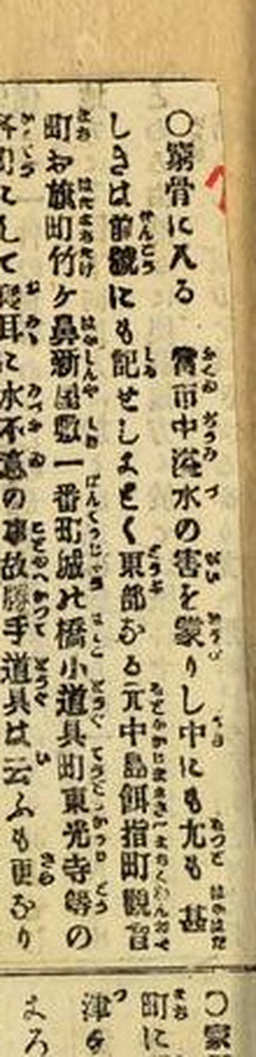しきは前號にも記せしことく東部なる元中島餌指町観音
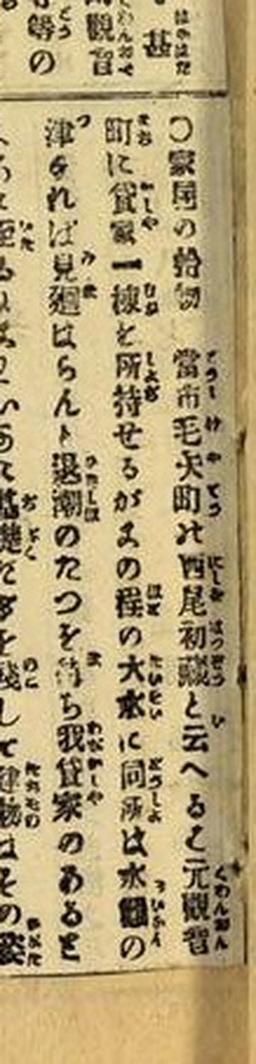町に貸家一棟を所持せるがこの程の大水に同所は水難の
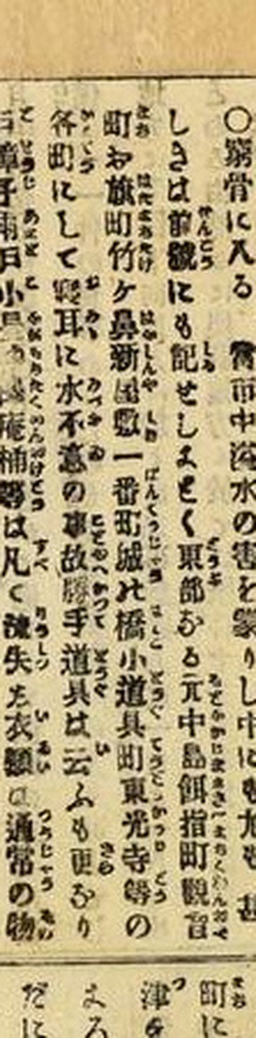町お旗町竹ヶ鼻新屋敷一番町城の橋小道具町東光寺等の
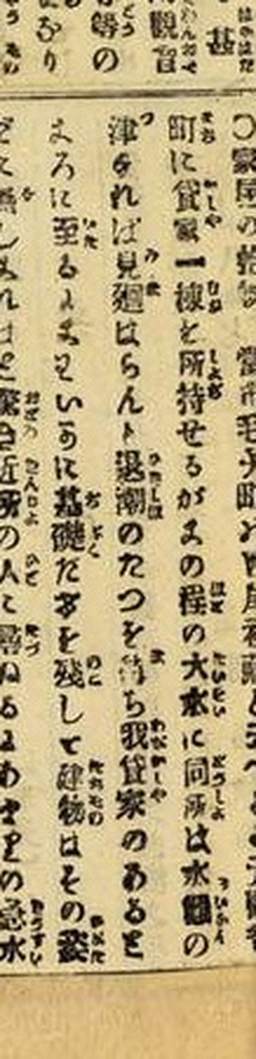津なれば見廻はらんと退潮のたつを待ち我貸家のあると
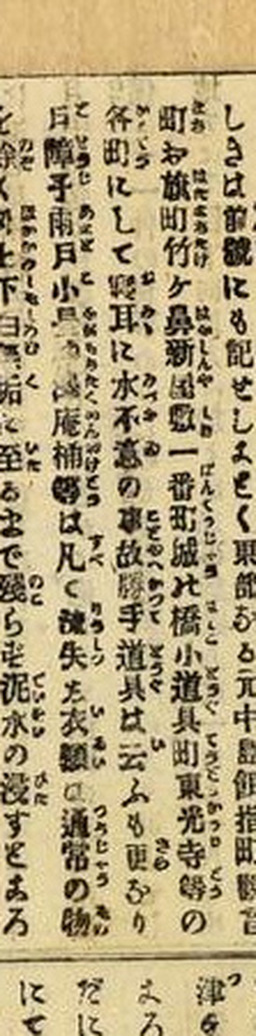各町にして寝耳に水不意の事故勝手道具は云ふも更なり
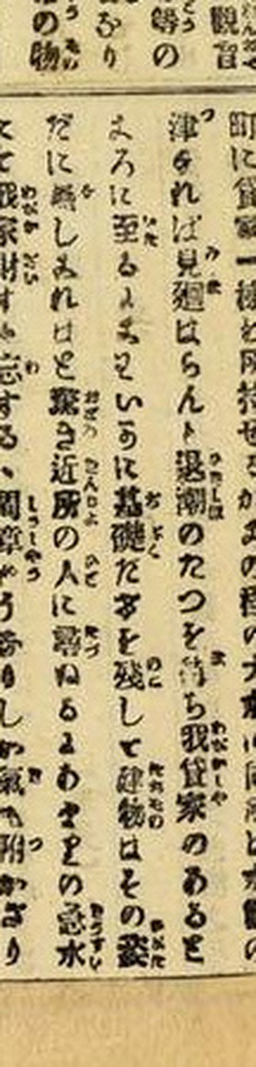ころに至るにこわいかに基礎だけを殘して建物はその姿
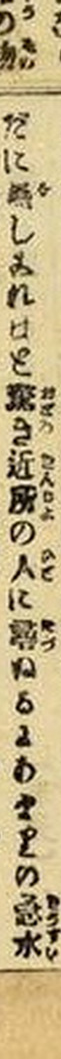だに無しこれはと驚き近所の人に尋ぬるにあまりの急水
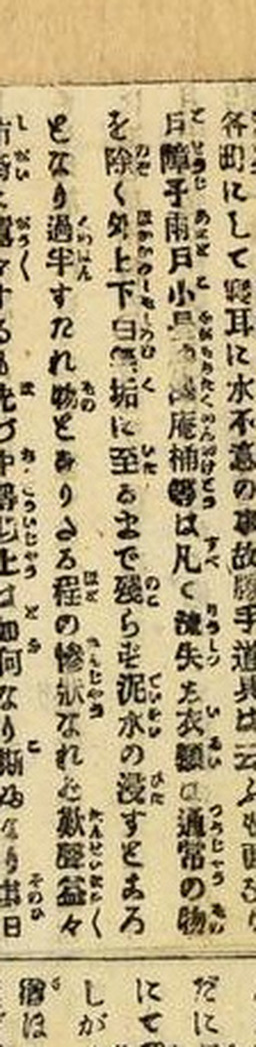を除く外上下白無垢に至るまで殘らず泥水の浸すところ
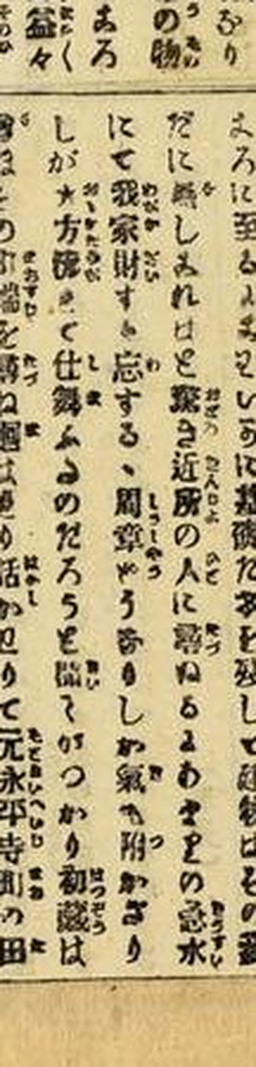にて我家財すら忘するゝ周章どうなりしか氣も附かざり
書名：温古集 五巻
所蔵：福井県文書館 Fukui Prefectural Archives
